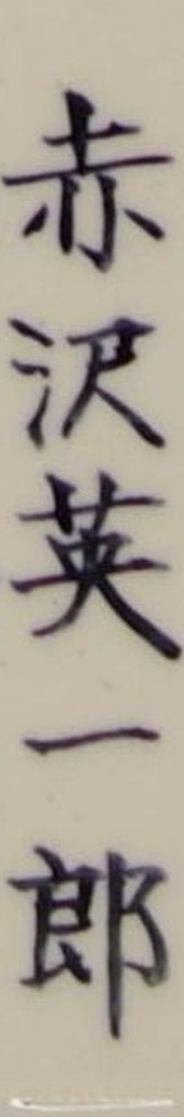赤沢英一郎
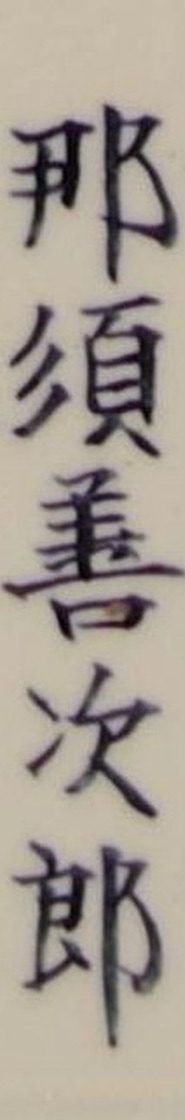那須善次郎
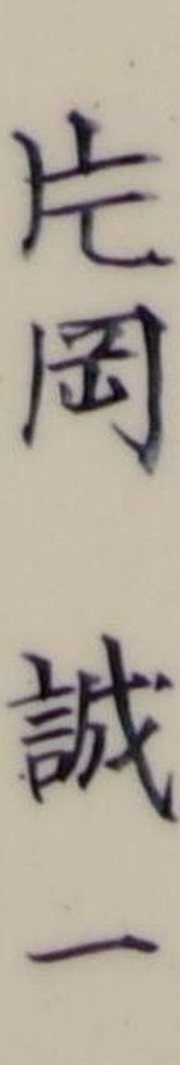片岡誠一
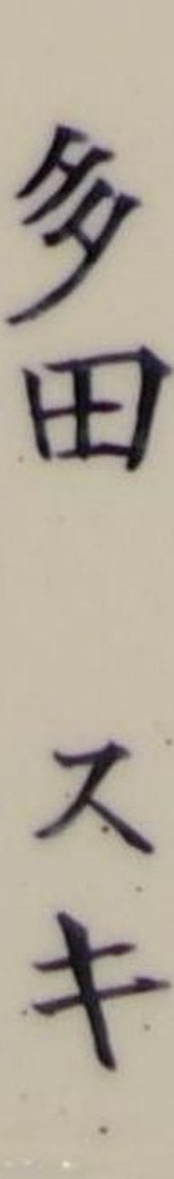多田スキ
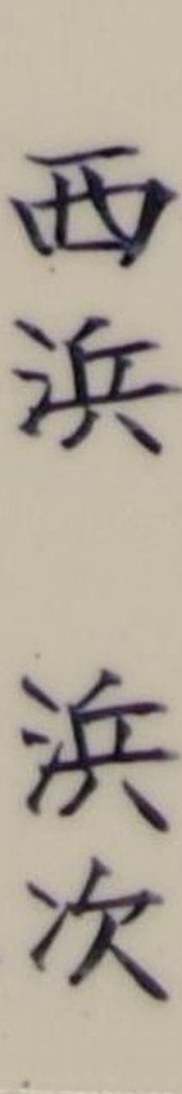西浜浜次
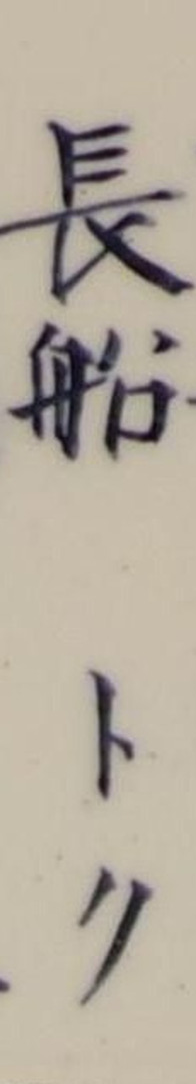長船トク
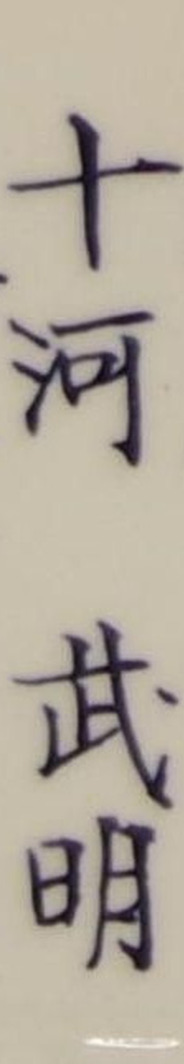十河武明
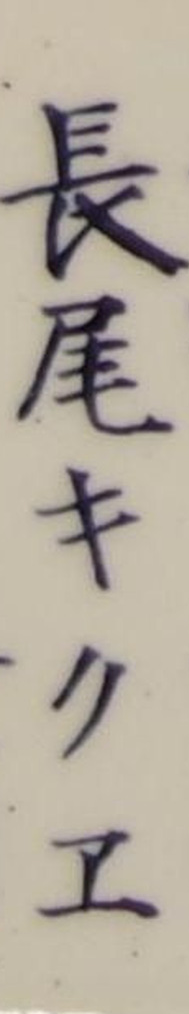長尾キクヱ
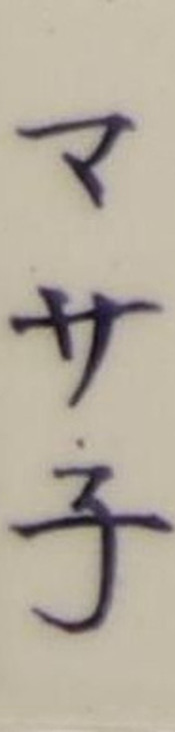マサ子

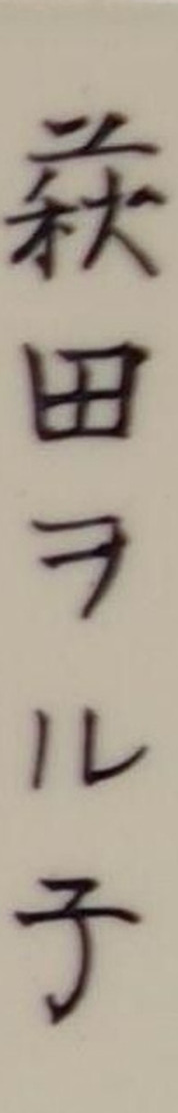荻田ヲル子
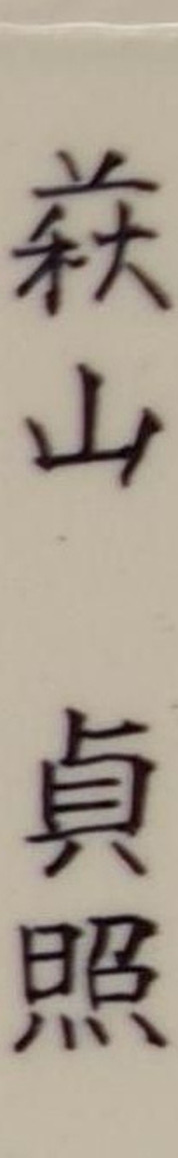萩山貞照
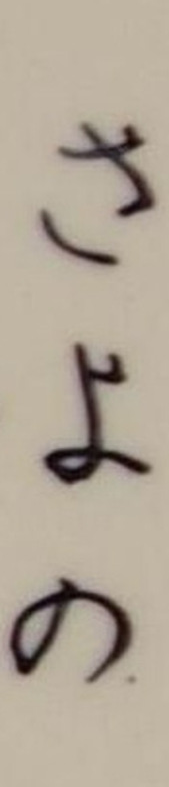さよの
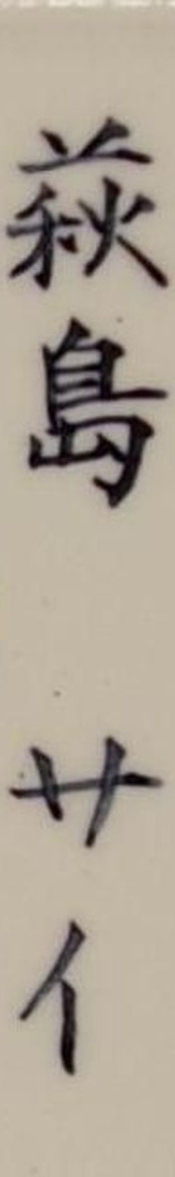萩島サイ
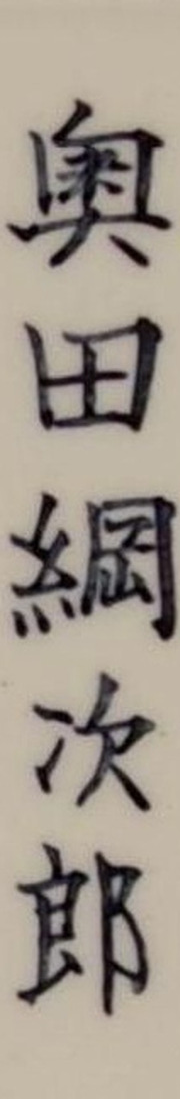奥田綱次郎
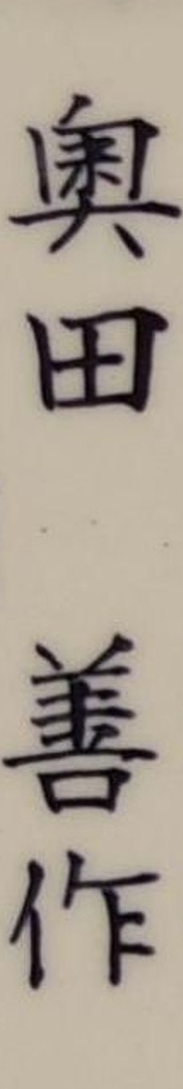奥田善作
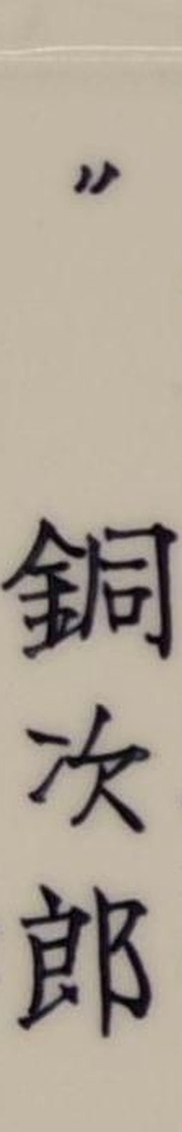銅次郎
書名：E~L
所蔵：高野山金剛峯寺
